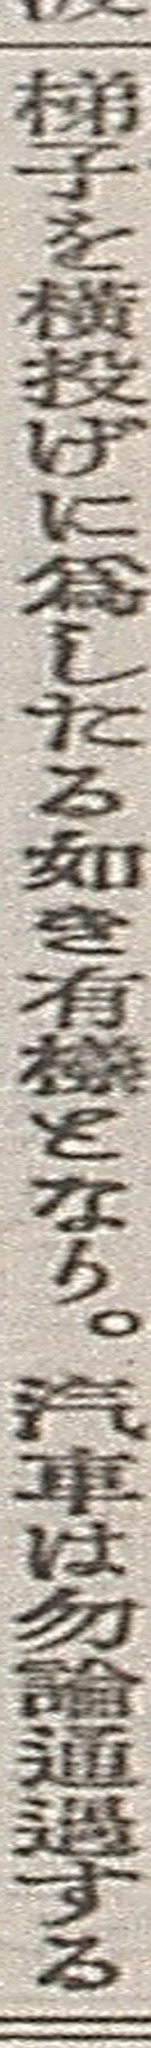梯子を横投げに為したる如き有様となり。汽車は勿論通過する
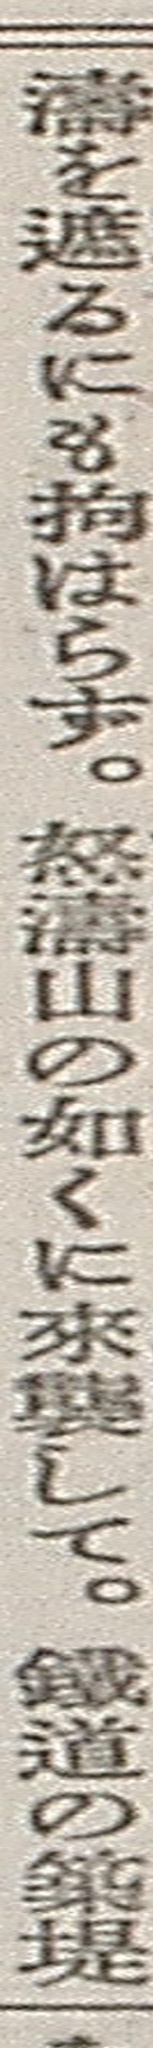濤を遮るにも拘はらず。怒濤山の如くに来襲して。鉄道の築堤
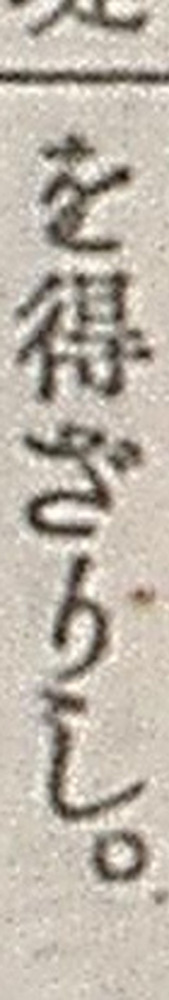を得ざりし。
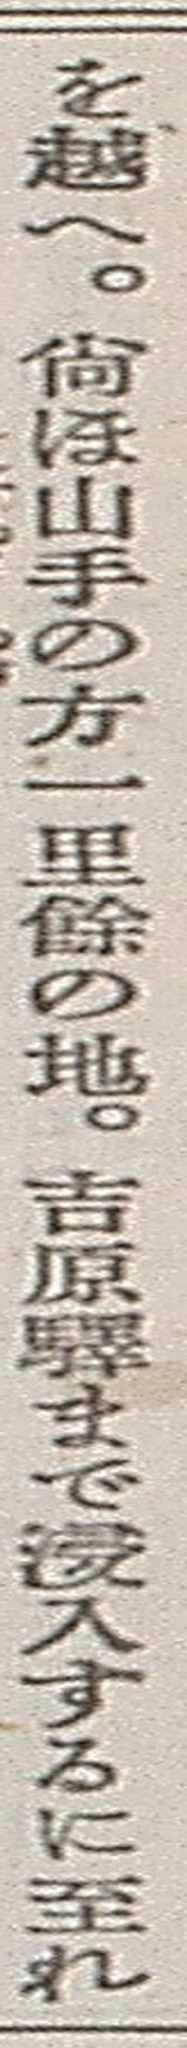を越へ。尚ほ山手の方一里余の地。吉原駅まで侵入するに至れ
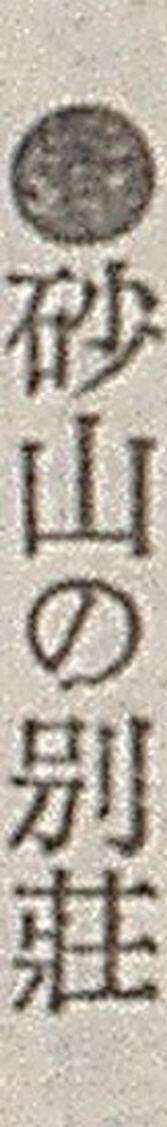●砂山の別荘
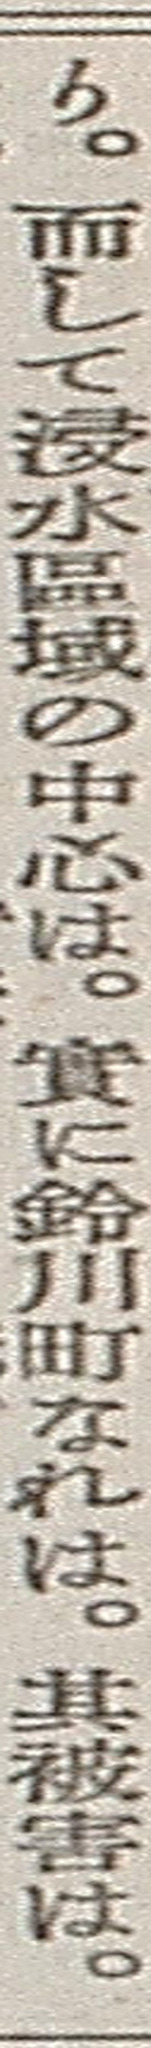り。而して浸水区域の中心は。実に鈴川町なれは。其被害は。
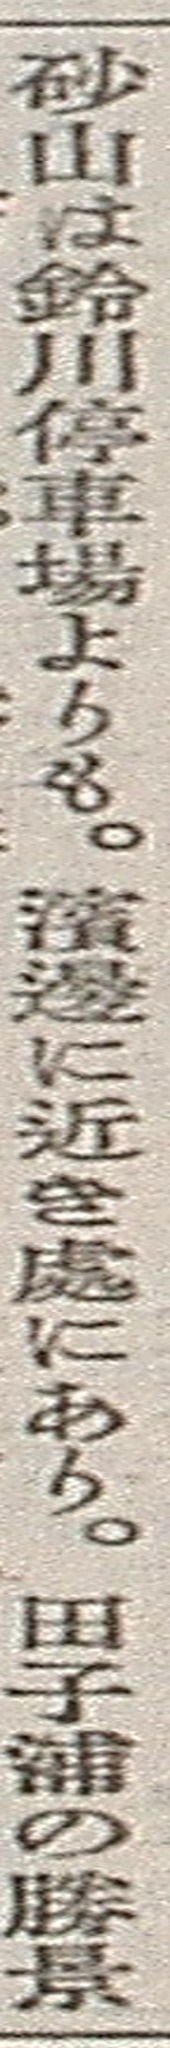砂山は鈴川停車場よりも。浜辺に近き処にあり。田子浦の勝景
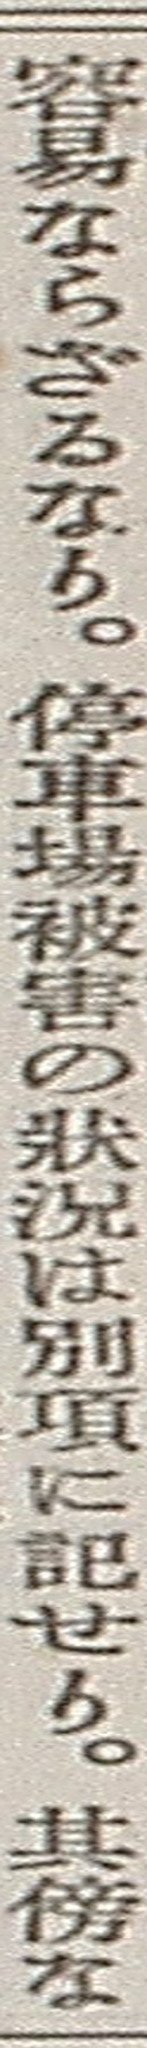容易ならざるなり。停車場被害の状況は別項に記せり。其傍な
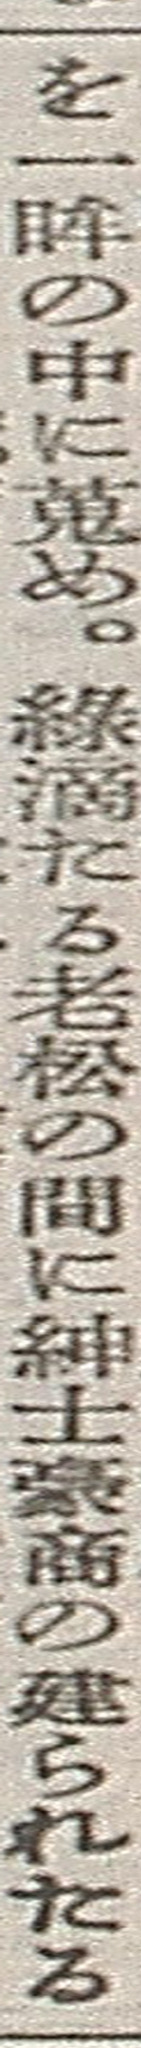を一眸の中に蒐め。緑滴たる老松の間に紳士豪商の建られたる
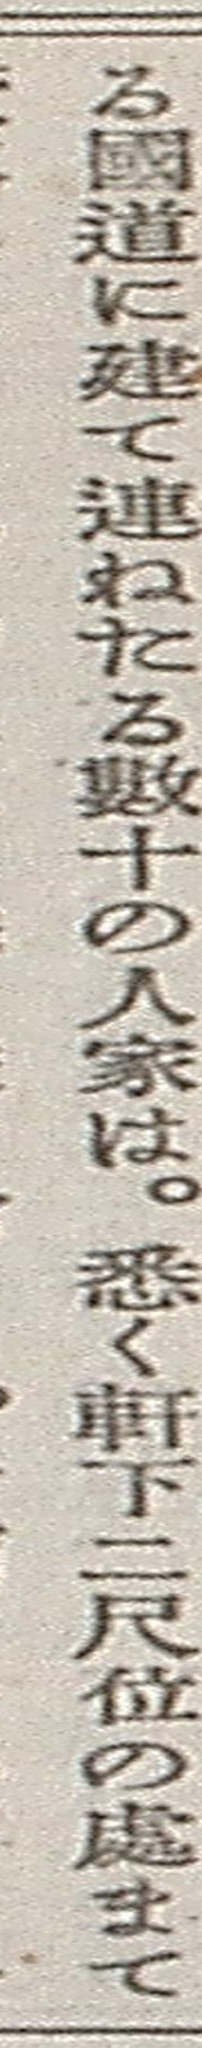る国道に建て連ねたる数十の人家は。悉く軒下二尺位の処まて
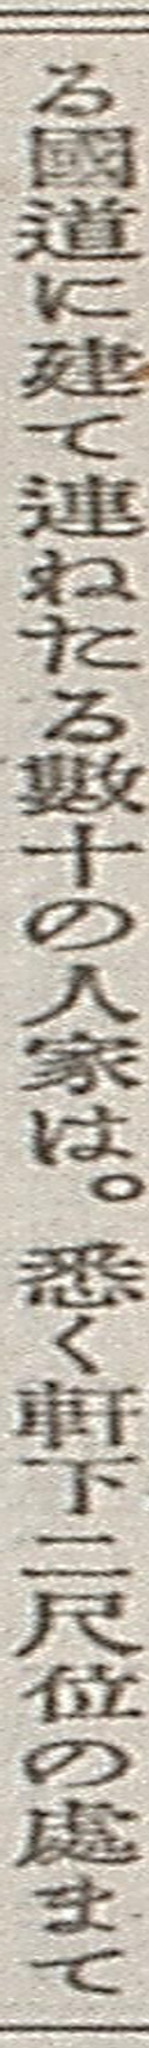る国道に建て連ねたる数十の人家は。悉く軒下二尺位の処まて
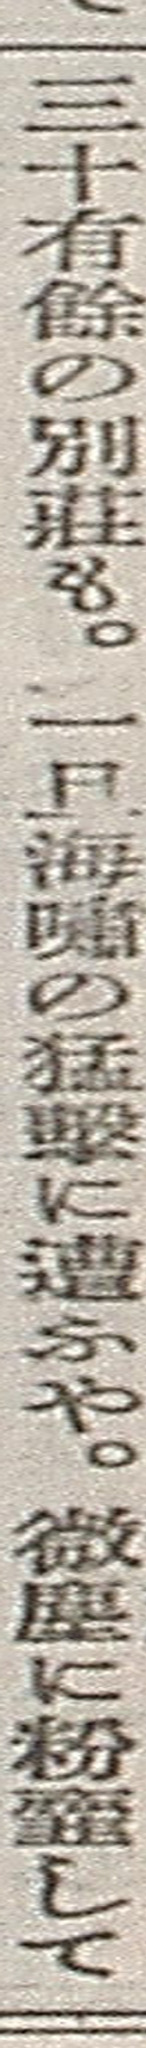三十有余の別荘も。一旦海嘯の猛撃に遭ふや。微塵に粉韲して
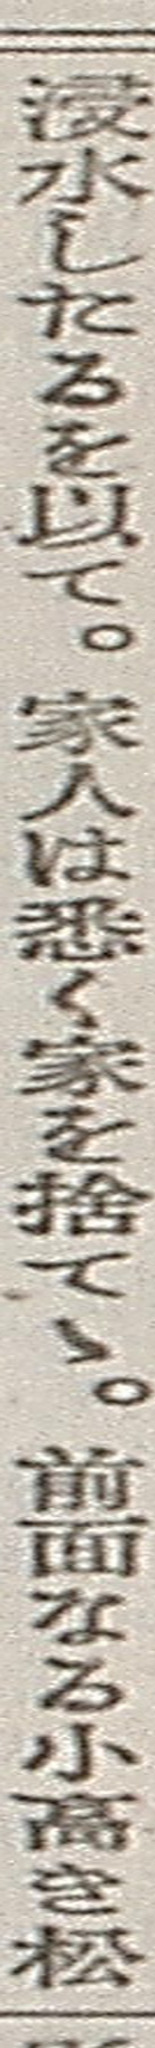浸水したるを以て。家人は悉く家を捨てゝ。前面なる小高き松
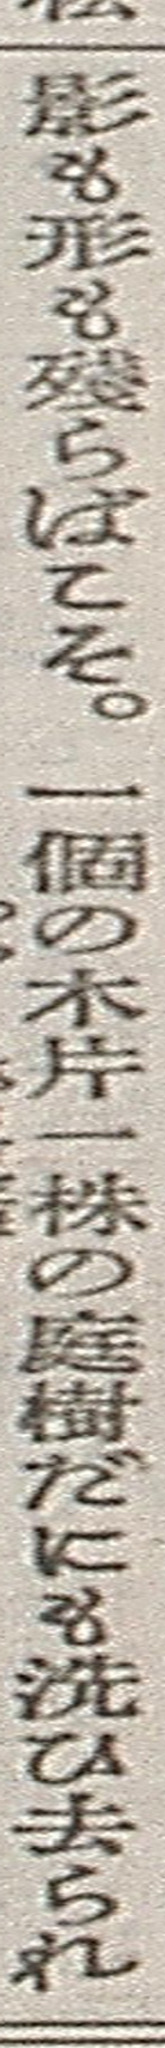影も形も残らばこそ。一個の木片一株の庭樹だにも洗ひ去られ
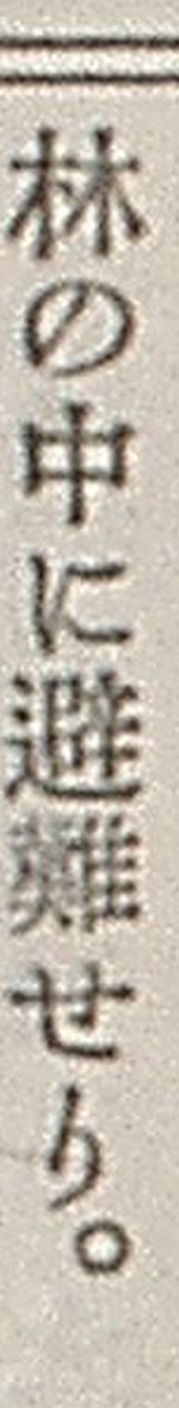林の中に避難せり。
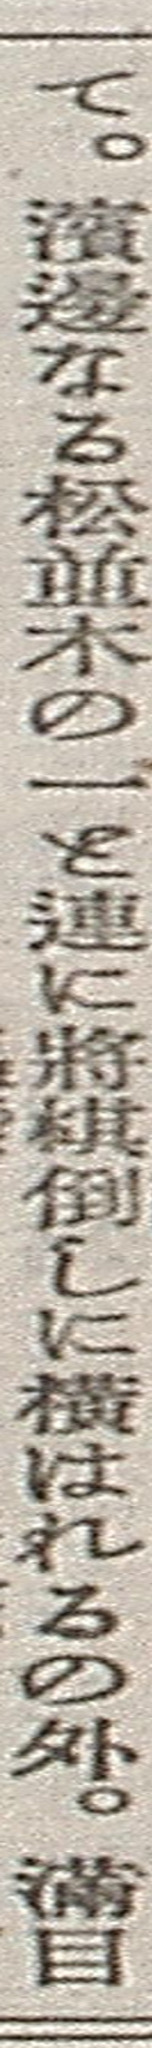て。浜辺なる松並木の一と連に将棋倒しに横はれるの外。満目
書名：風俗畫報臨時増刊第百九十九號　明治三十二年十月各地災害圖會（前編之續）
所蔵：東京大学地震研究所図書室 Earthquake Research Institute Library, The University of Tokyo, JAPAN
